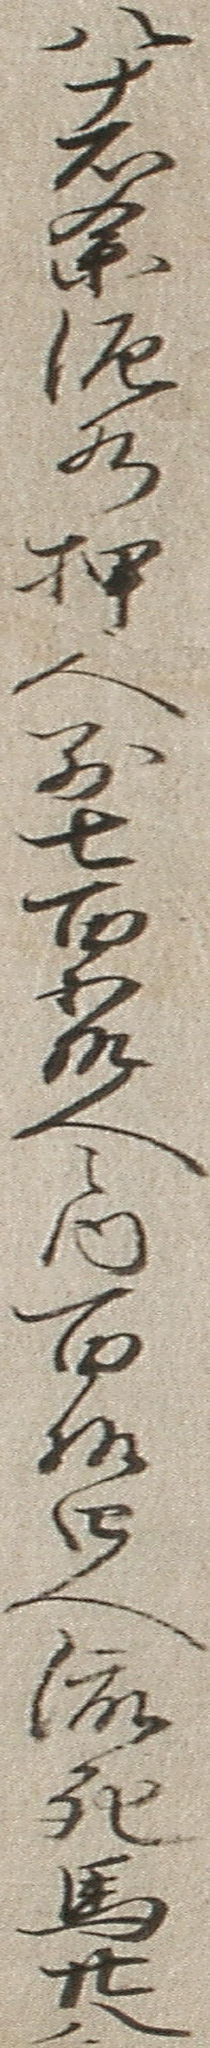八十石余泥水押人別七百九拾人之内百拾四人流死馬廿八
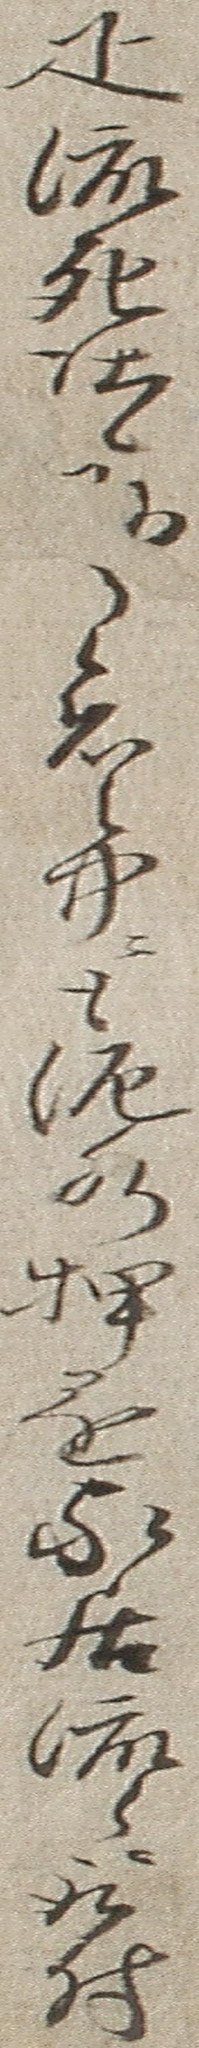疋流死仕候助候者之中にも泥水押懸家居流候に取付
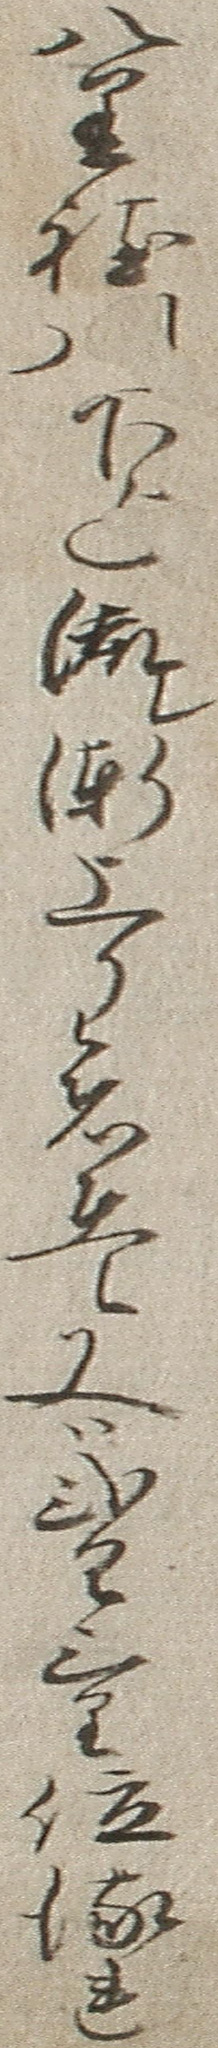八里程川下迄流れ漸上り候者在之又は弐里三里位流れ
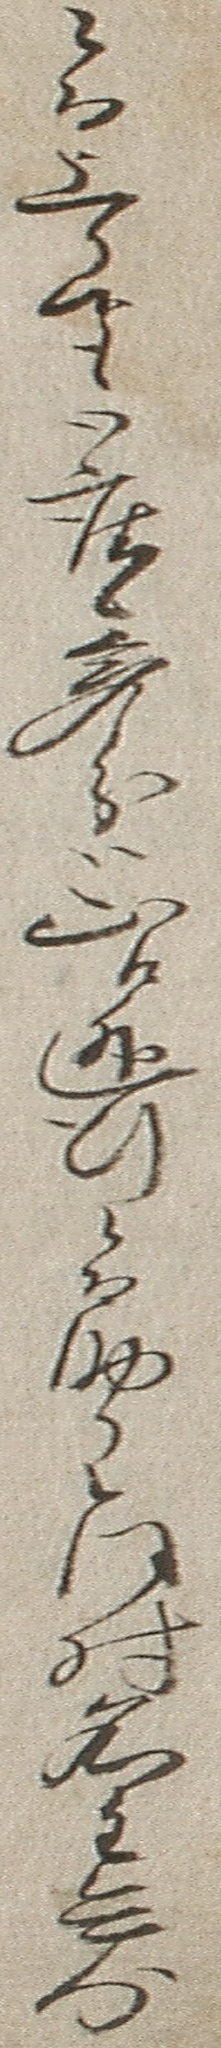候而上り候も御座候多分は山江逃行候而助り候同村名主兵右衛門
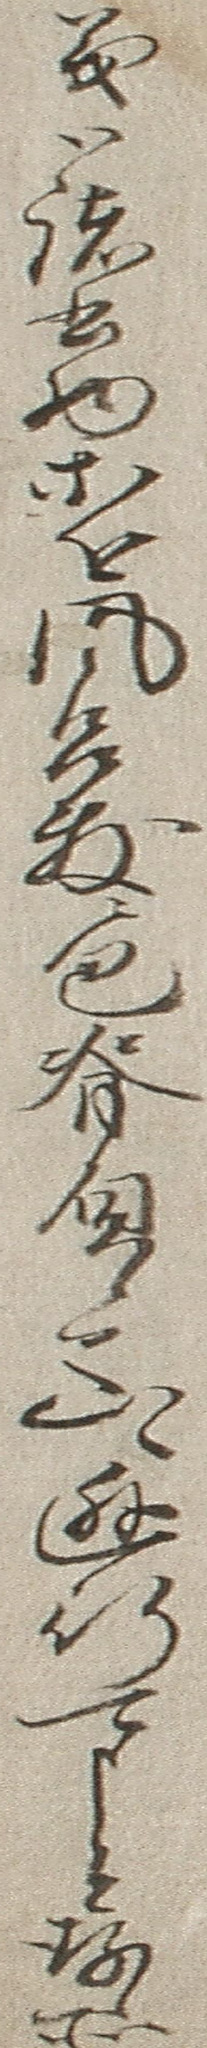義は諸書物等を風呂敷に包背負候而山へ逃行可申と存候所

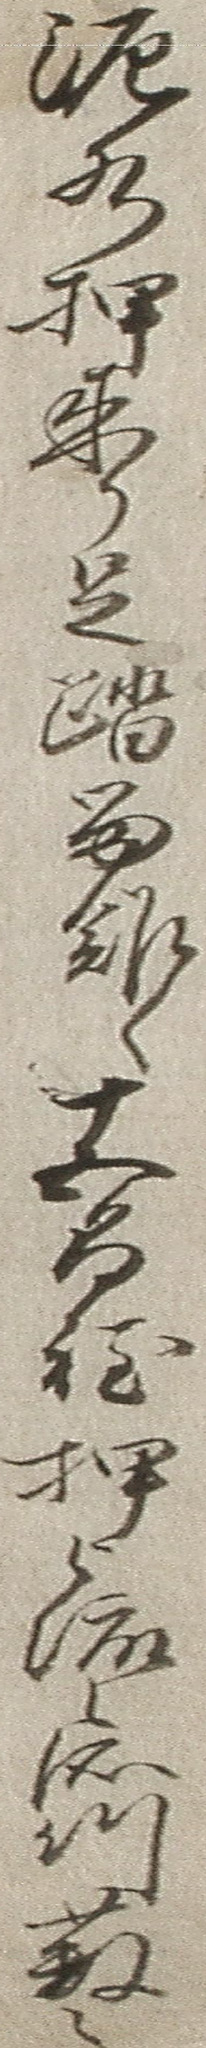泥水押来り足踏留難く十五間程押被流候所竹藪之
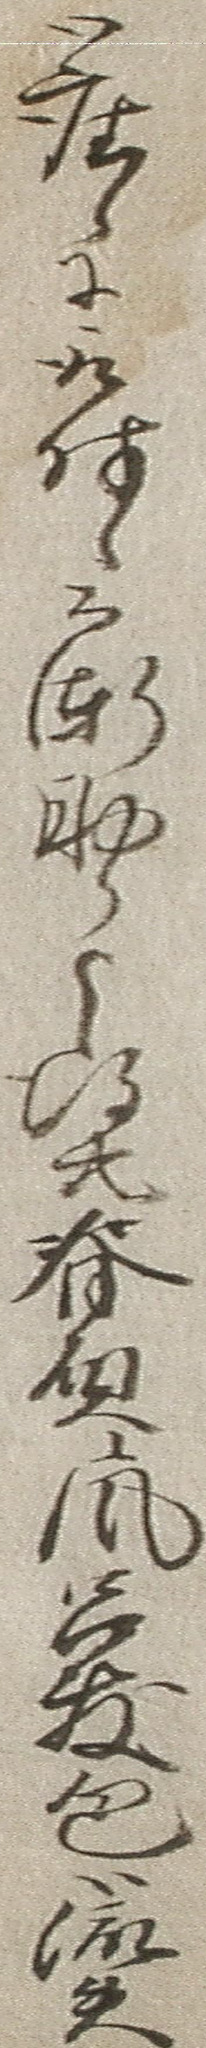御座候に取付候而漸助り申候得共背負候風呂敷包は流失
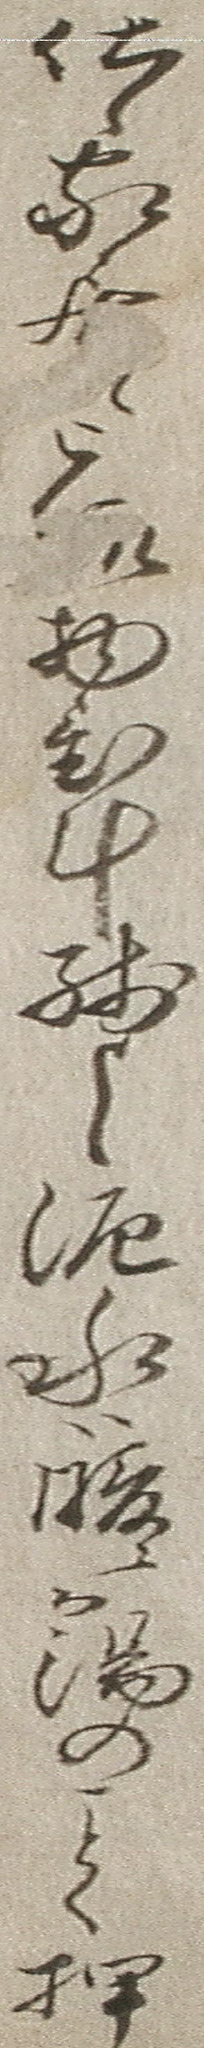仕候家居は被流物置斗残申候泥水ハ暖に而湯のことく押
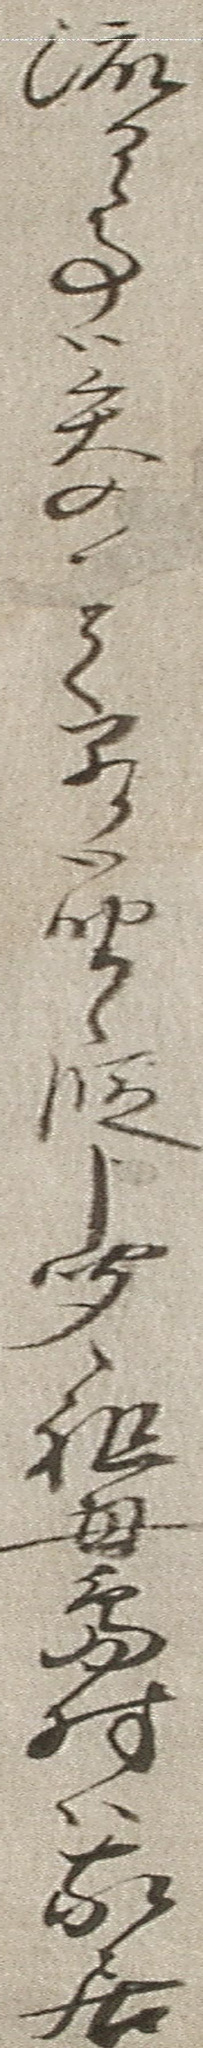流るゝ事は矢のことく早く御座候段申聞候祖母島村は家居
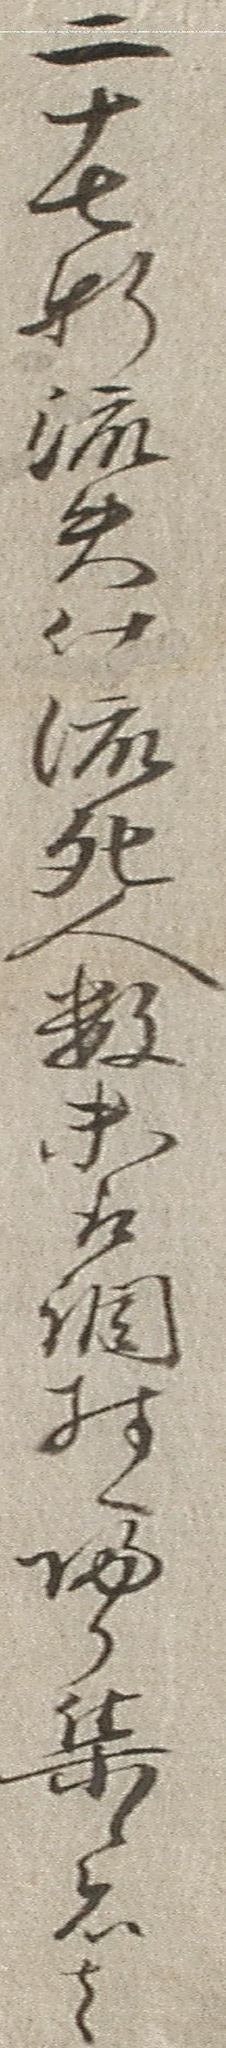二十七軒流失仕流死人数未取調村へ帰り集候者は
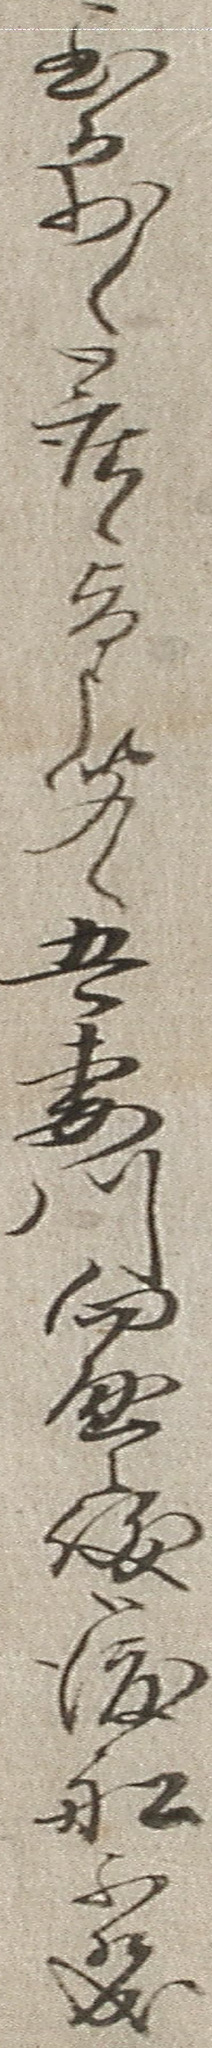至而少く御座候旨申聞候吾妻川向通之儀は渡船不相成
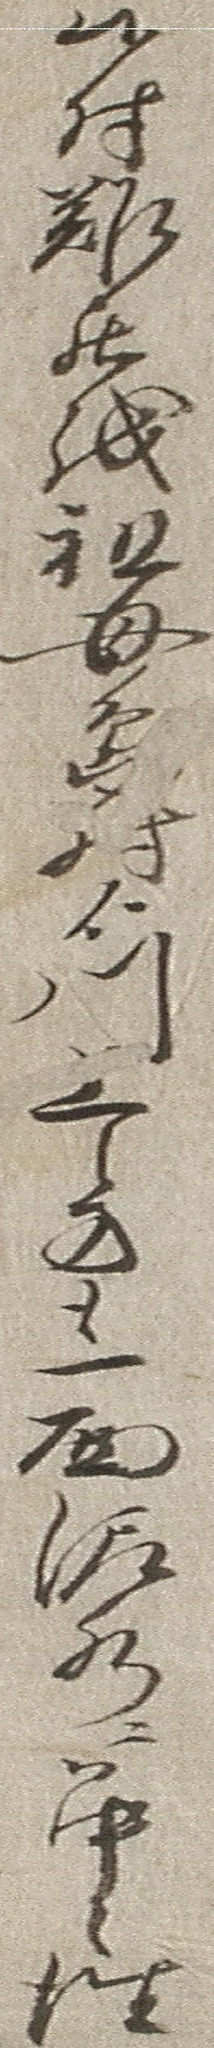候付難罷越祖母島村ゟ川上之方も一面泥水に而中々往
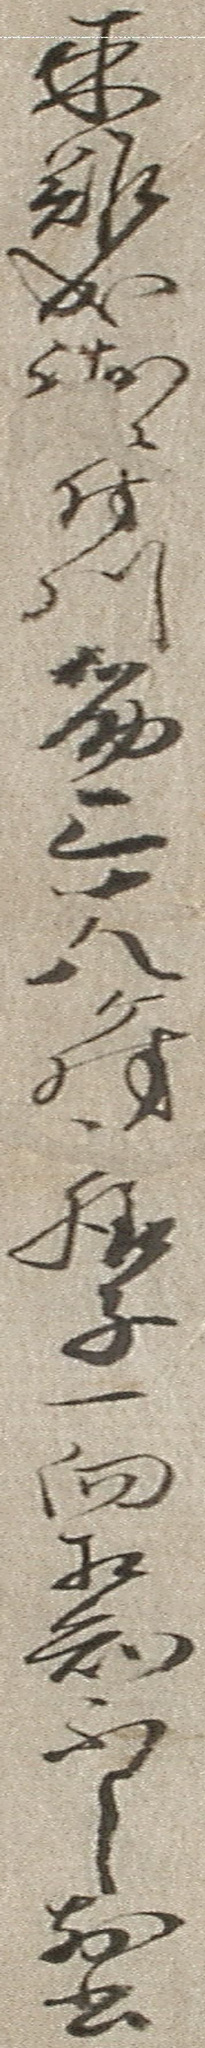来難成体に付川筋三十八ヶ村様子一向相知不申候前書
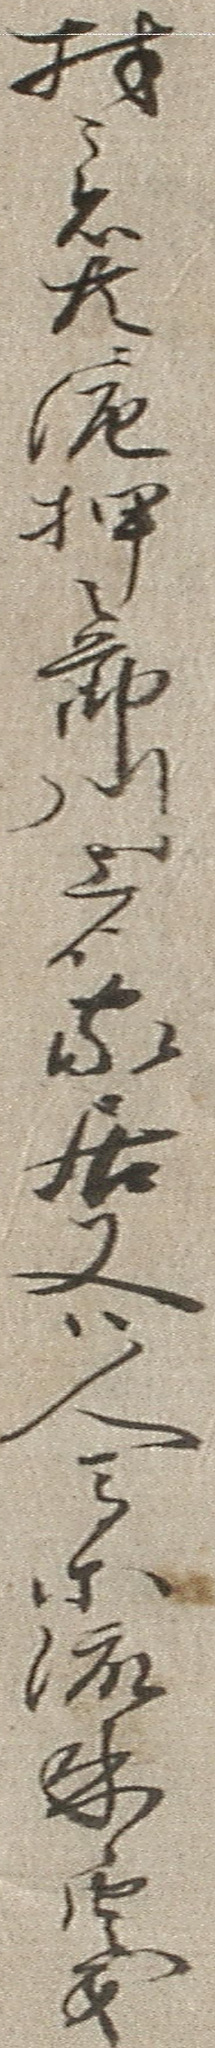村々之者共に泥押候節川上ゟ家居又は人馬等流来候由之義
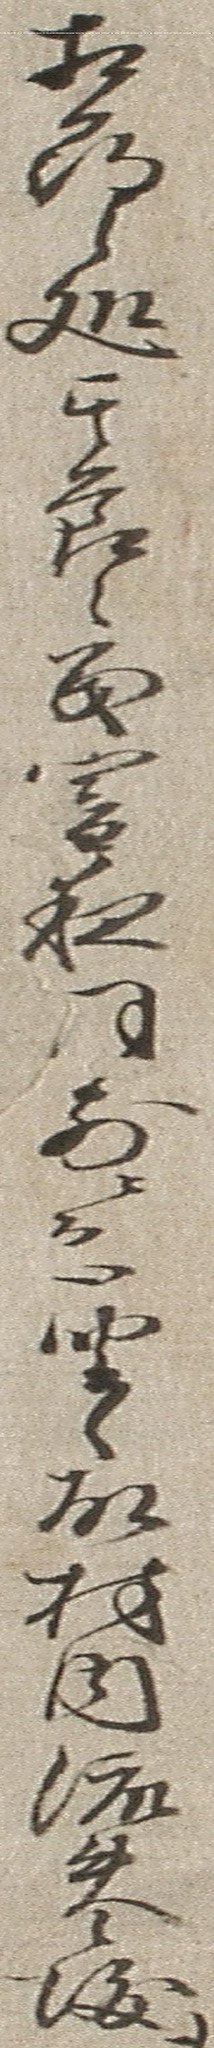相尋候処其節之義闇夜同前に而御座候故村内流失之儀も
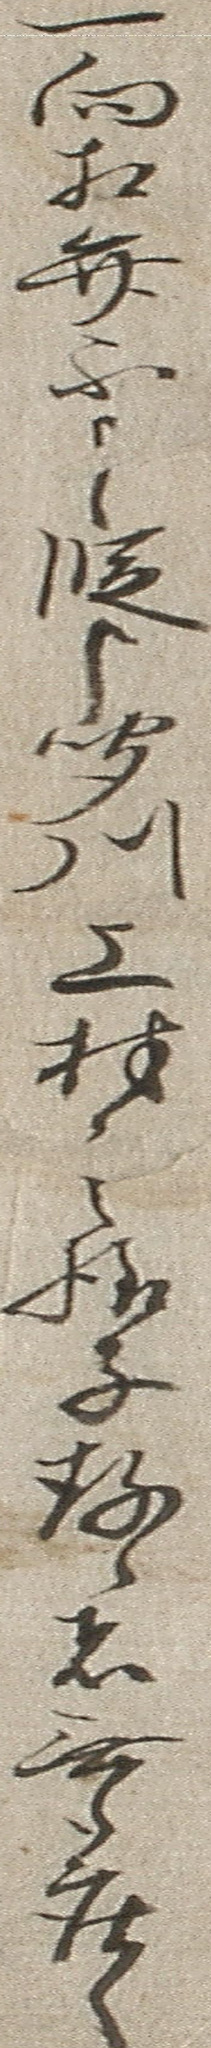一向相弁不申候段申聞川上村々之様子存候者無御座候
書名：太平秘録抜書　浅間山燒及普賢山崩
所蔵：東京大学地震研究所図書室 Earthquake Research Institute Library, The University of Tokyo, JAPAN
